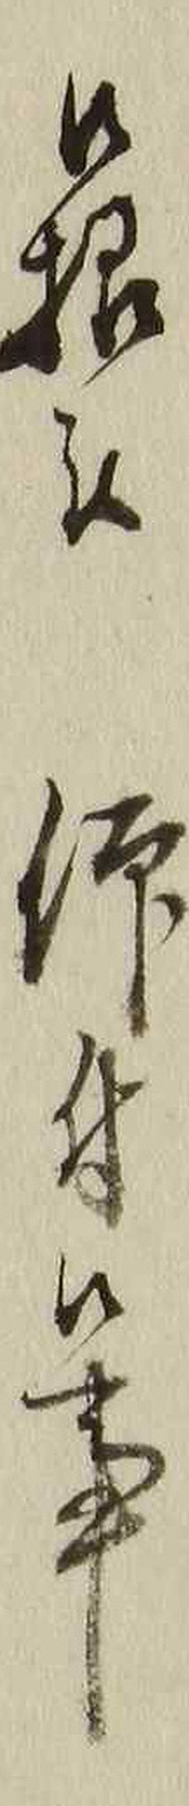候根被仰付候事
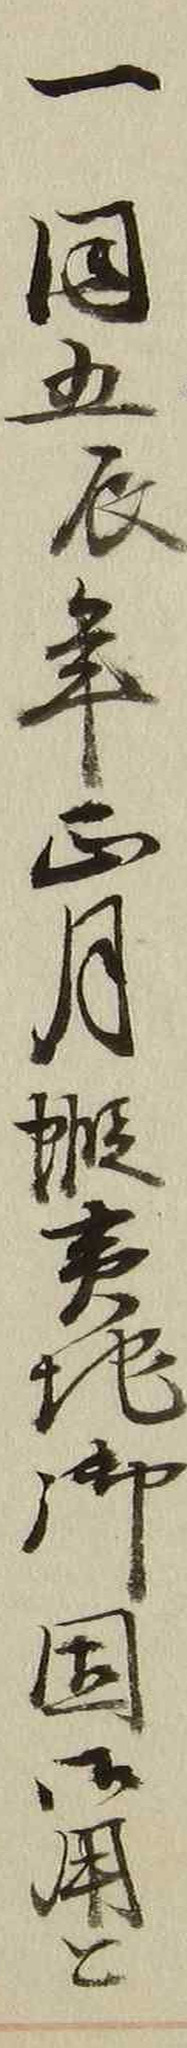一同五辰年正月蝦夷地御固御用と
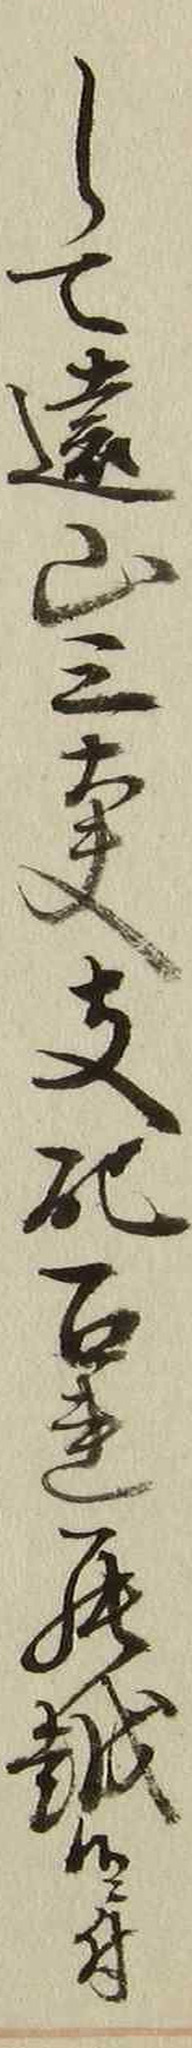して遠山三大夫支配召連罷越候ニ付
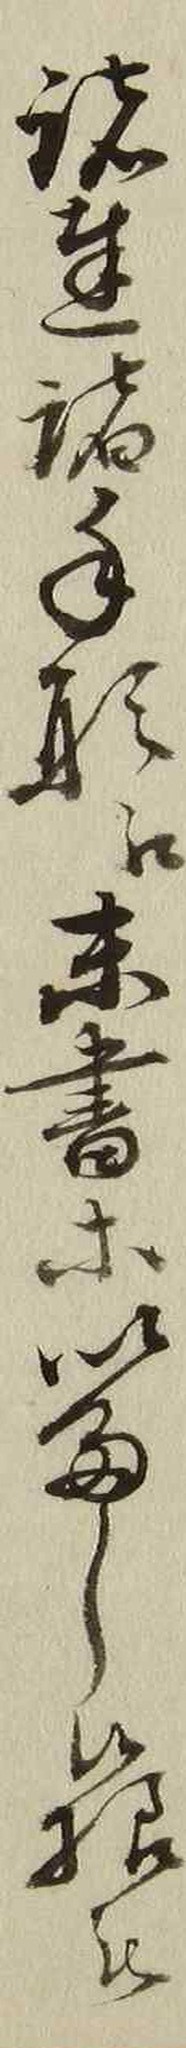諸達諸手形江末書等いたし候様被
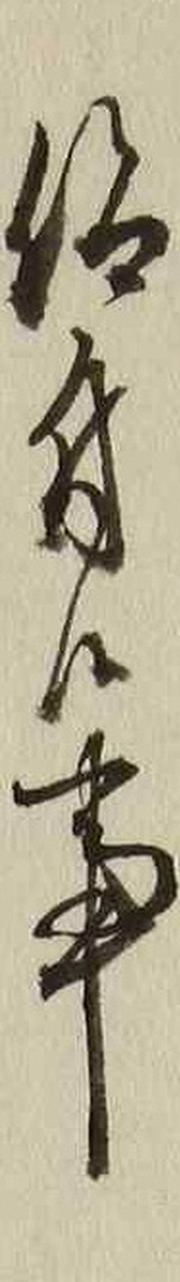仰付候事
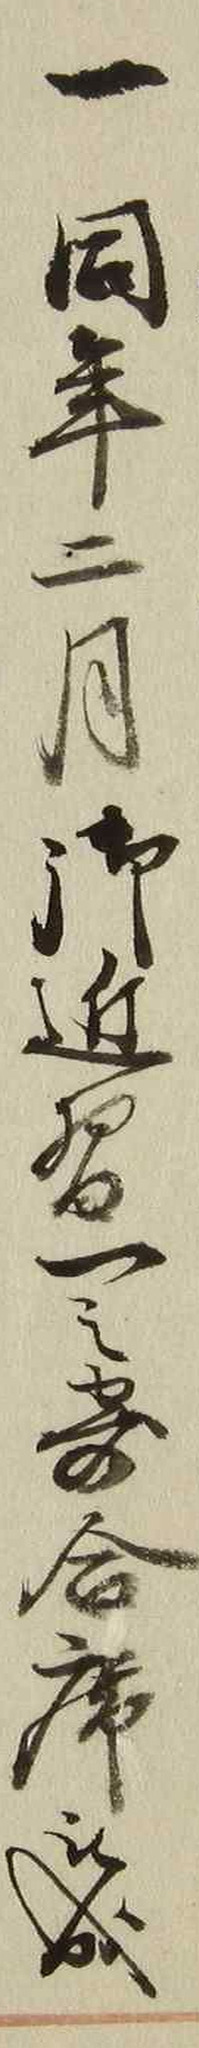一同年二月御近習一之寄合席被成
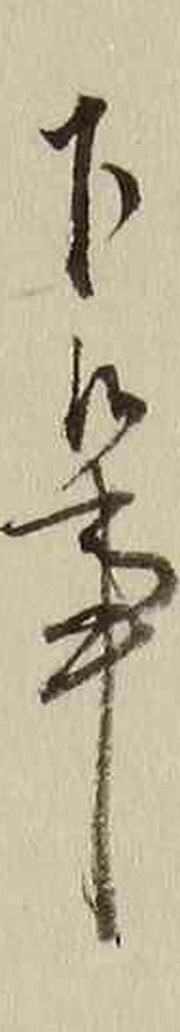下候事
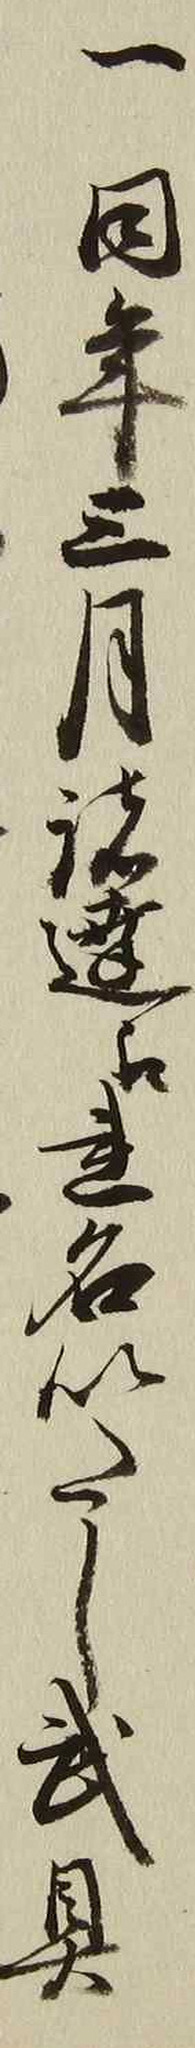一同年三月諸達被連名いたし武具
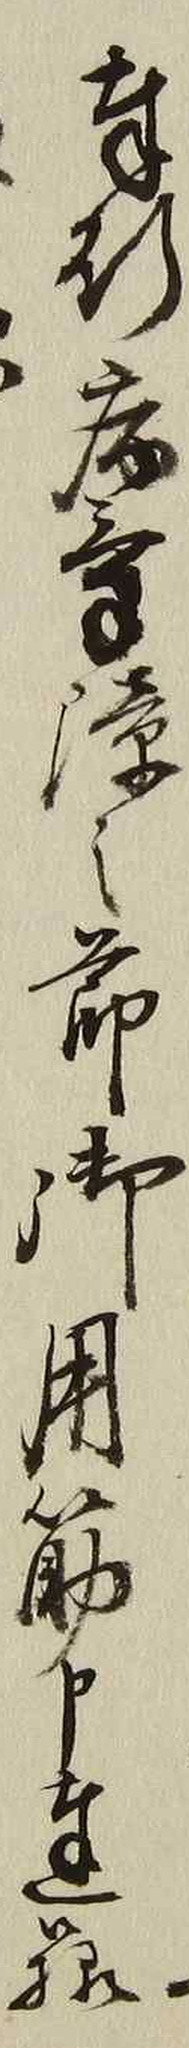奉行病気障之節御用筋申達候様
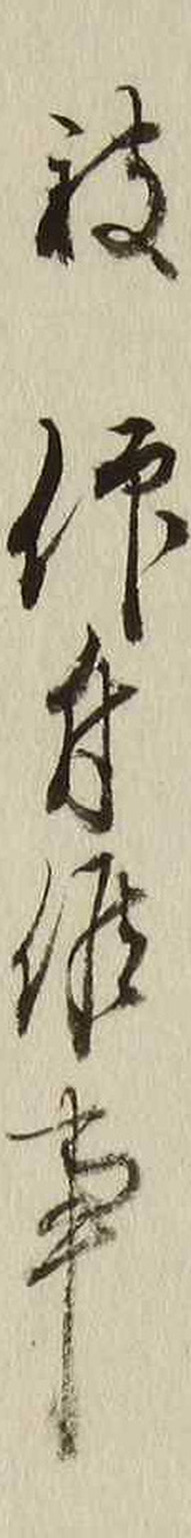被仰付候事
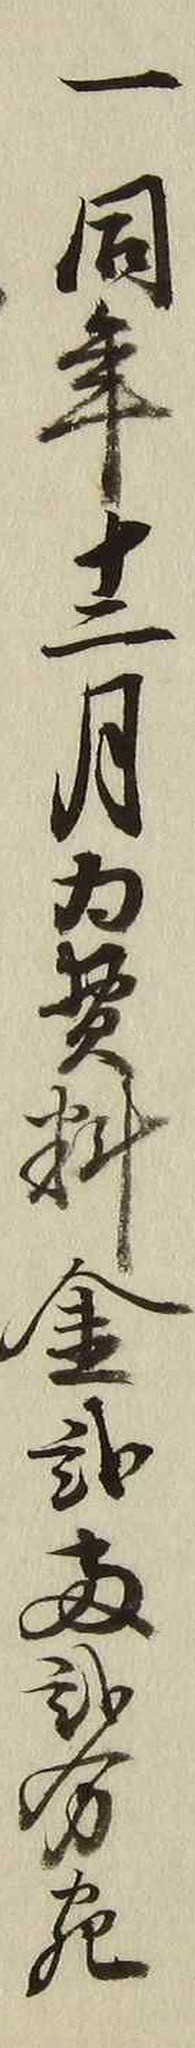一同年十二月為費料金弐両弐分宛
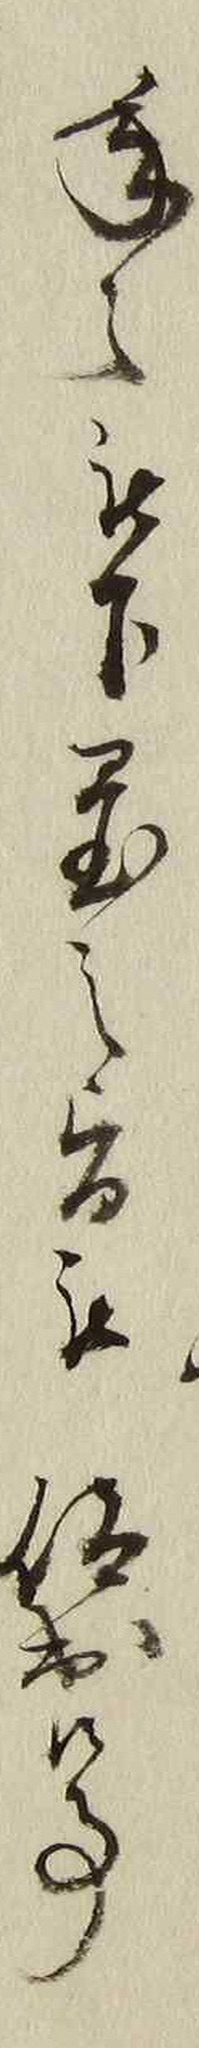年々被下置之旨被仰出候事
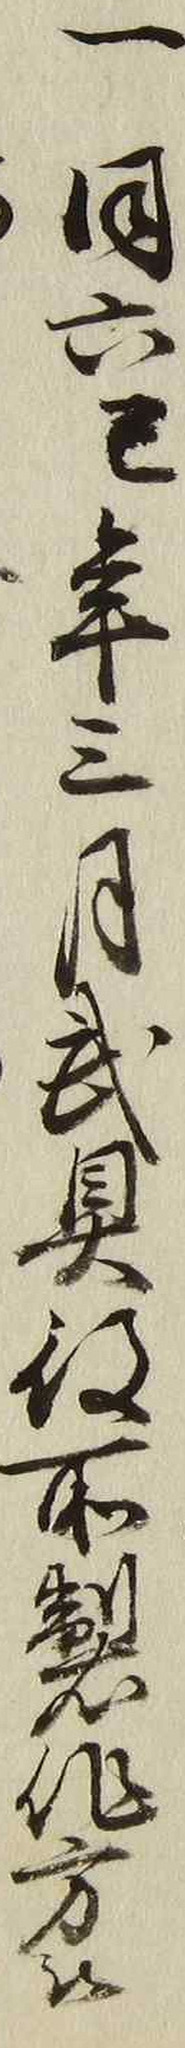一同六巳年三月武具役所製作方被
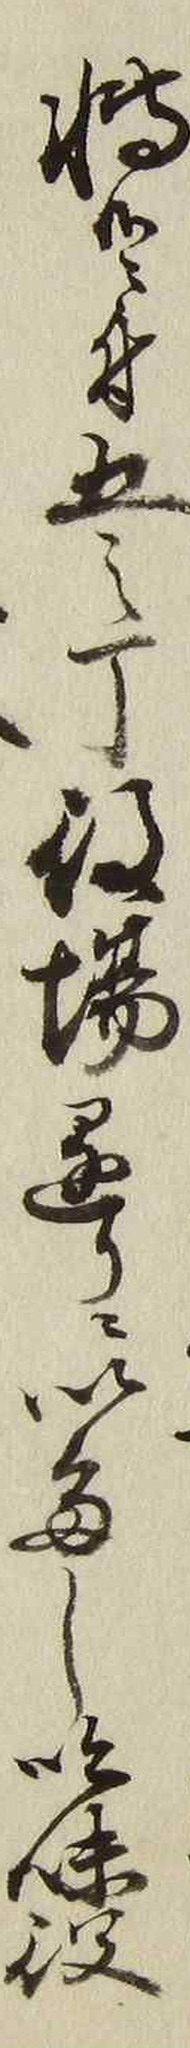転候ニ付五之丁役場懸りニいたし吟味役
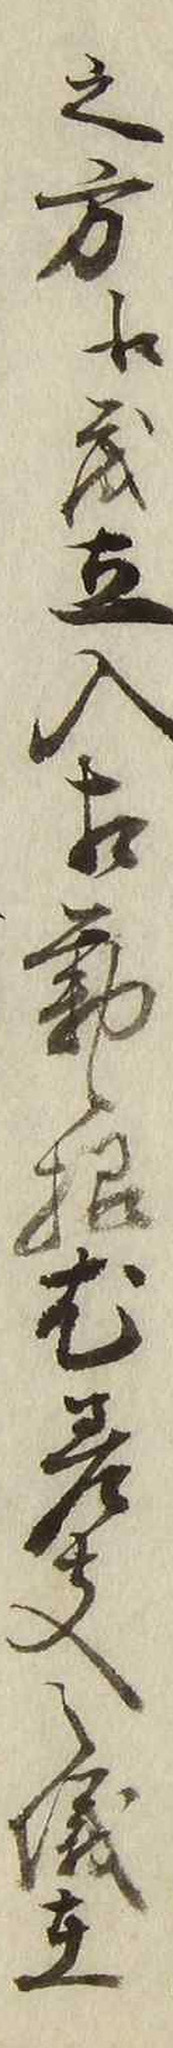之方江茂立入相勤候様尤差支之儀在
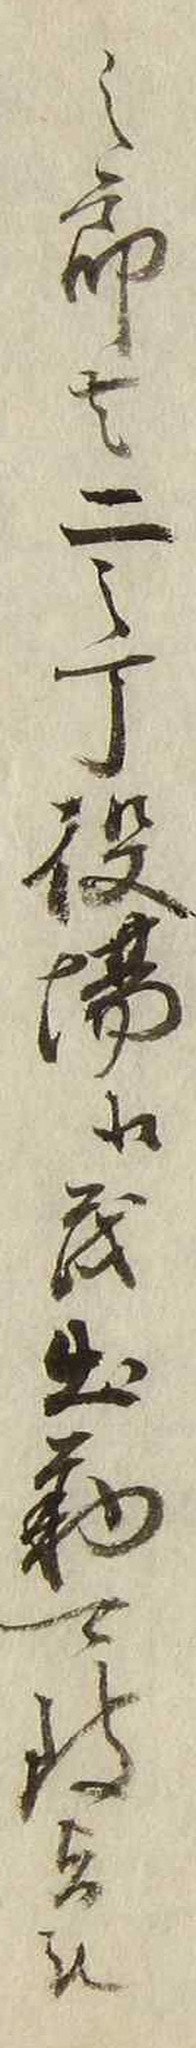之節者二之丁役場江茂出勤可致旨被
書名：諸士系譜　巻之36　は之部4
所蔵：会津若松市立会津図書館
